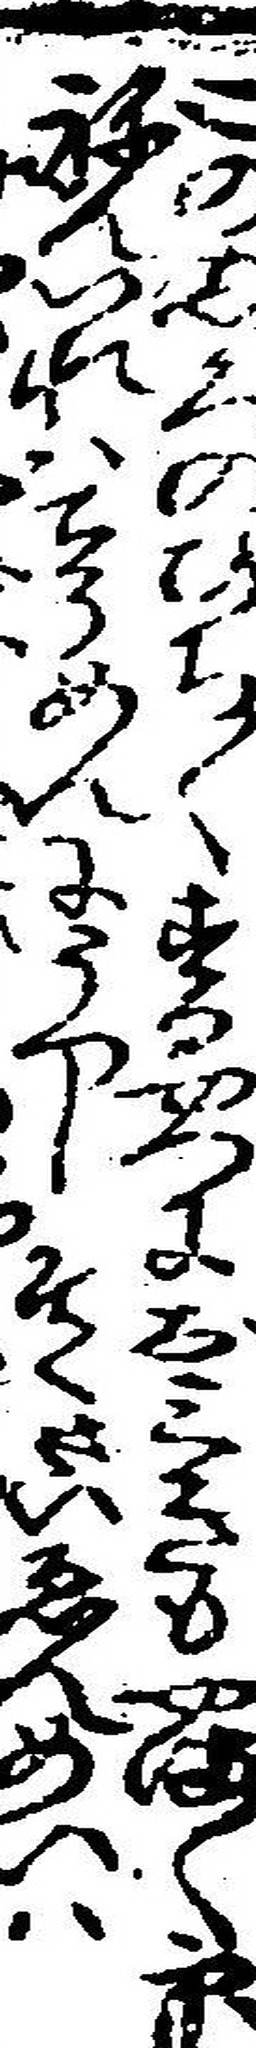ねんいれはてうめんにうつしそくさいゑんめいは
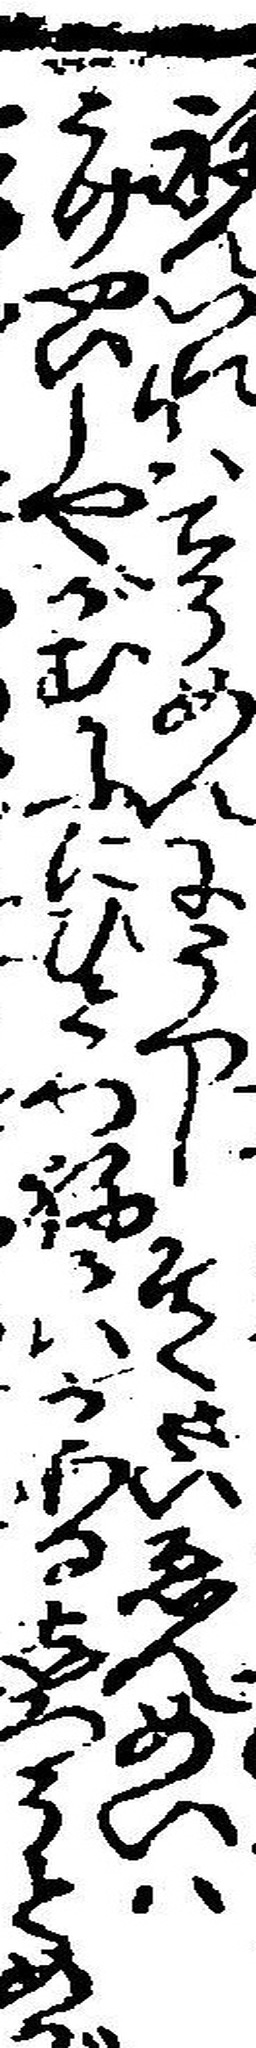うけやいしやがむかふにひとつねかいかあるしろうとめが
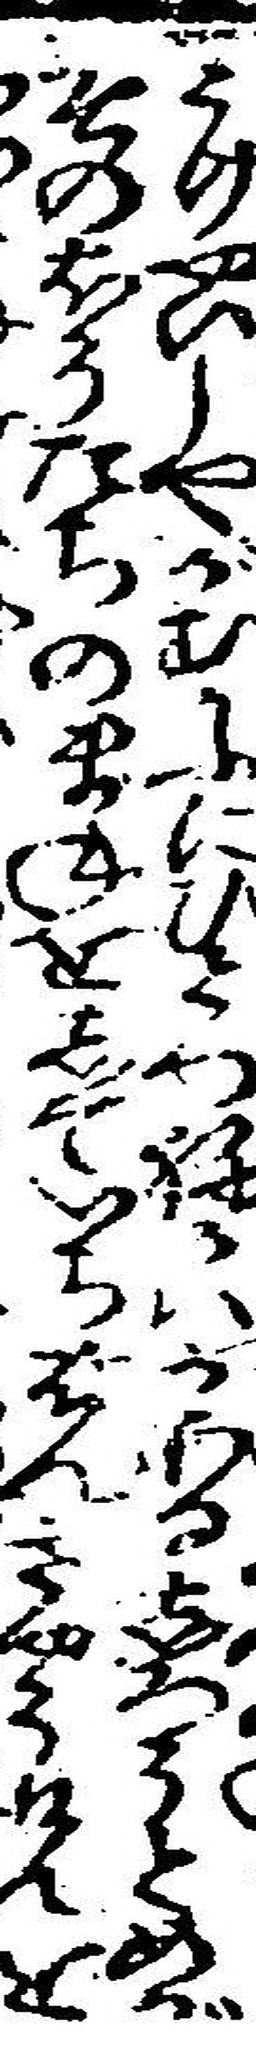そのほうたちのまねをしていちばんきやうけんを
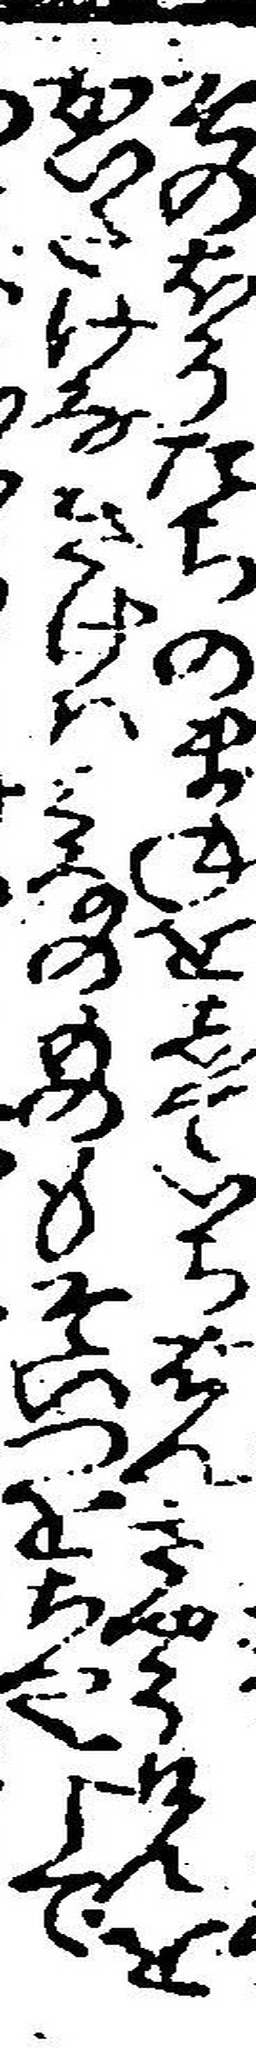かいたけなきけはみなのものもそいつをちやして
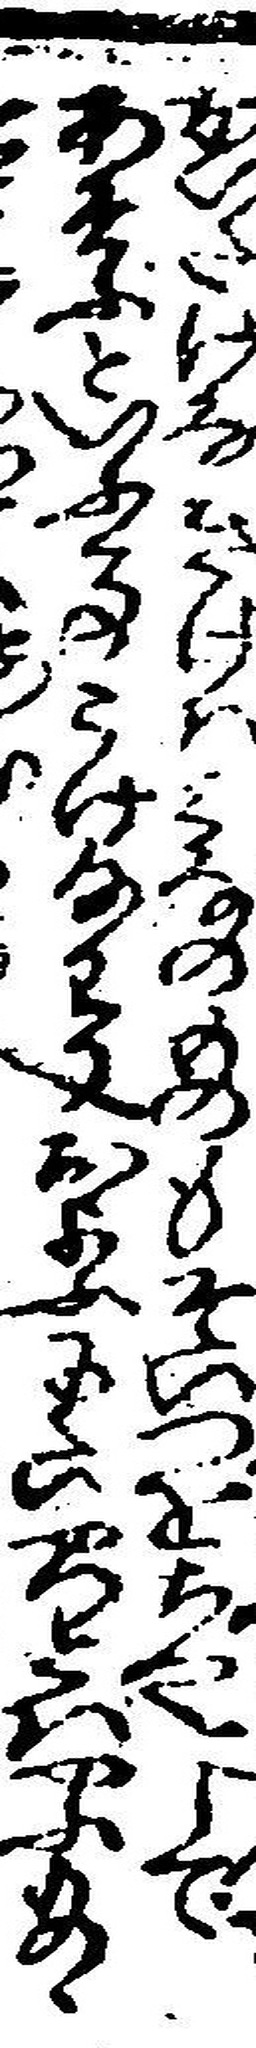あそふといふ事うけ給わりおよふにくいやつとはゆふものゝ
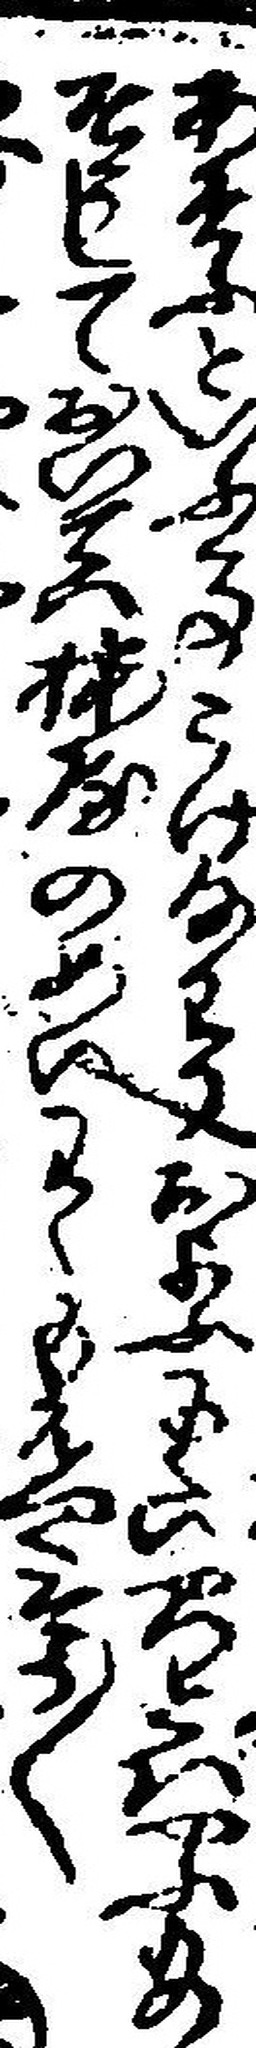そうしておいては梅屋のめいわくもはやそう〳〵
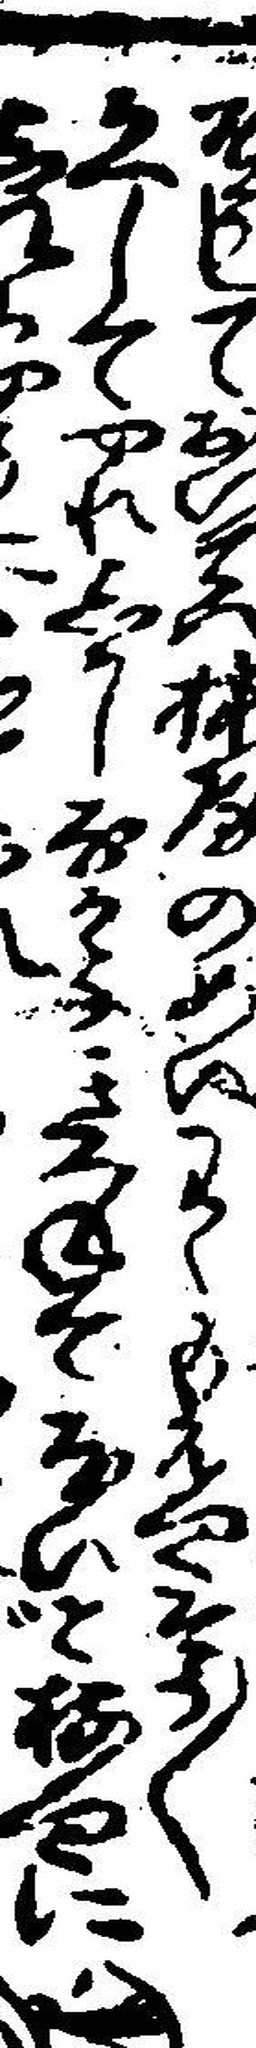かへしてやれしかしなからきつねてないと梅やに
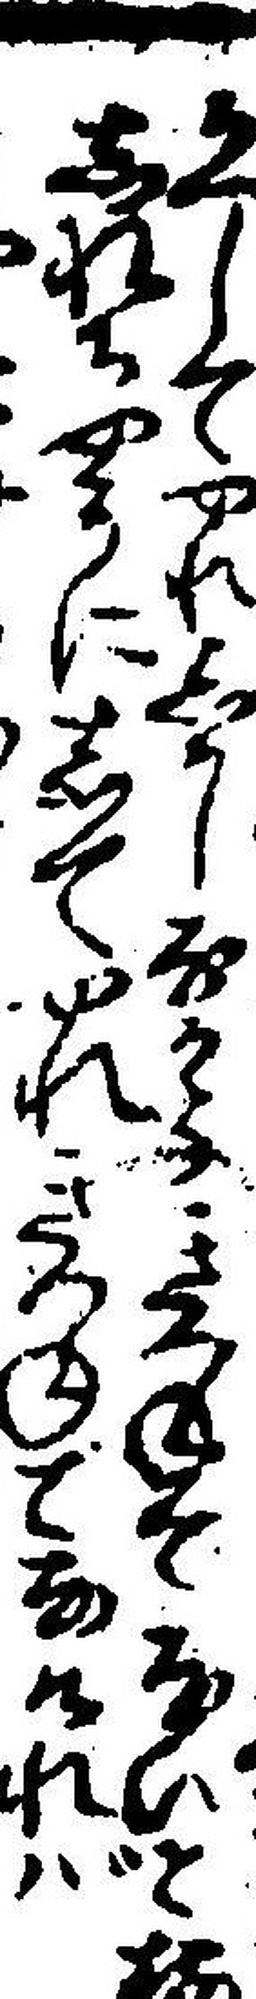しれやうにしてやれきつねでなければ
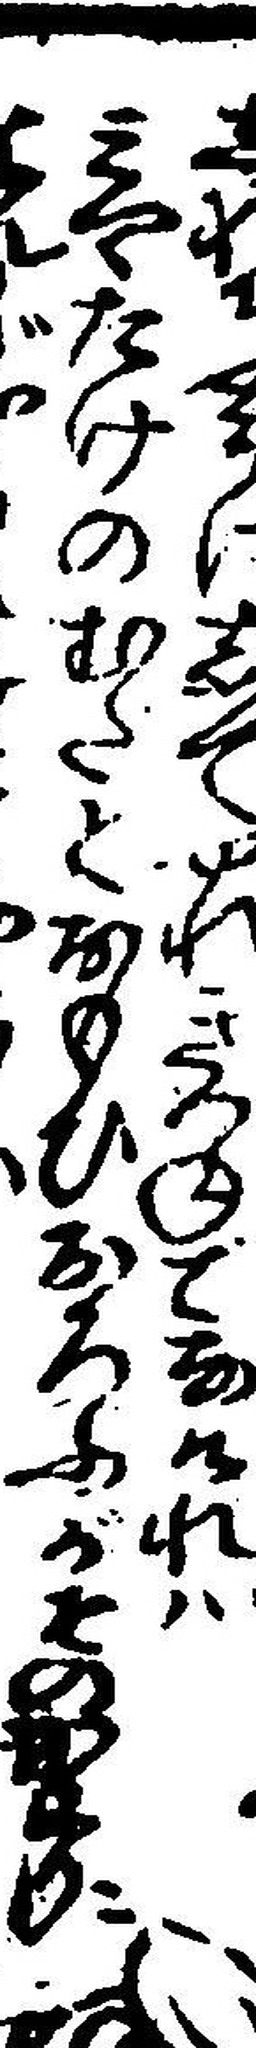みやたけのむだとおもひおろふがそのかわりに
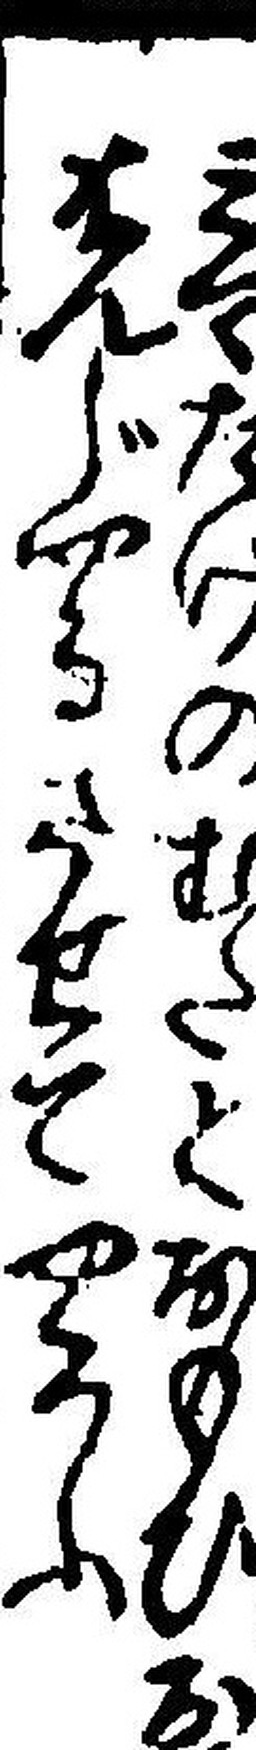はんじやうさせてやろふ

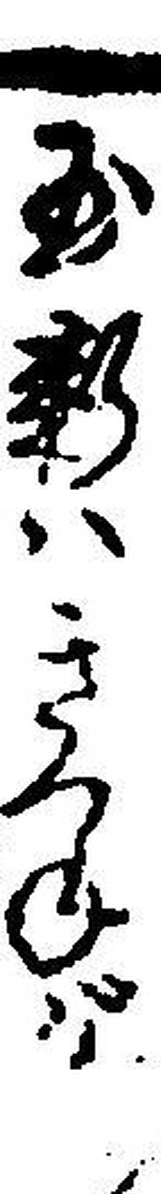玉新はきつねが
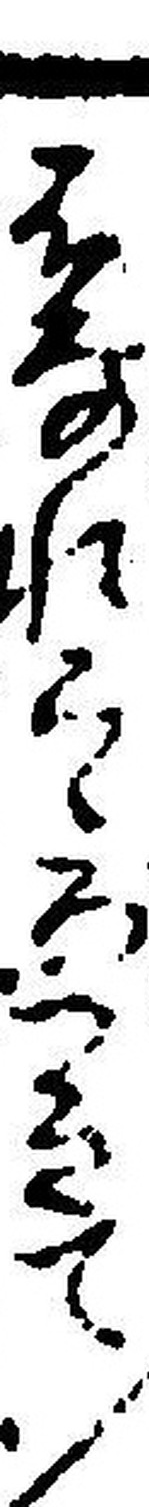はなれこゝろつきて
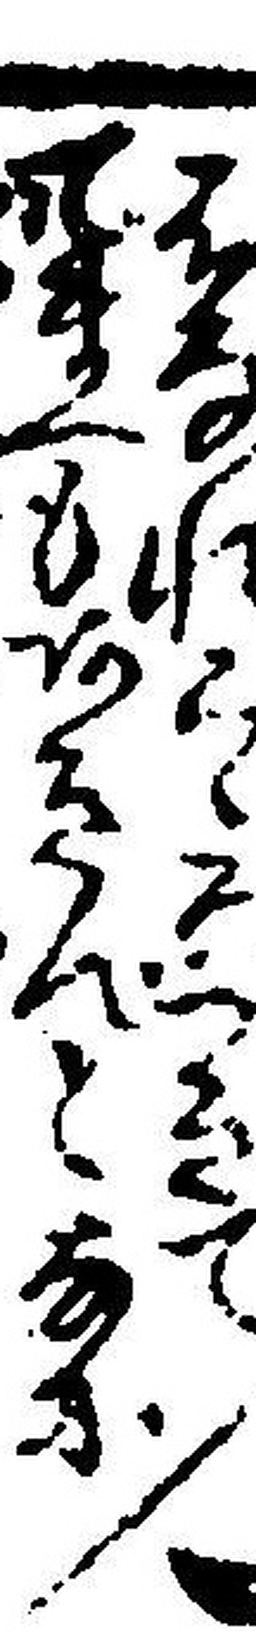てまへもあきんとなに
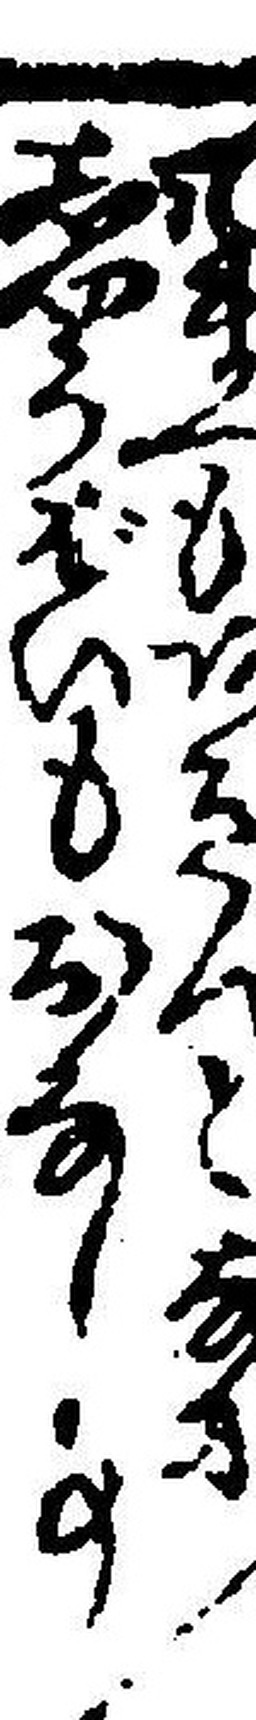しやうばいもおなし事
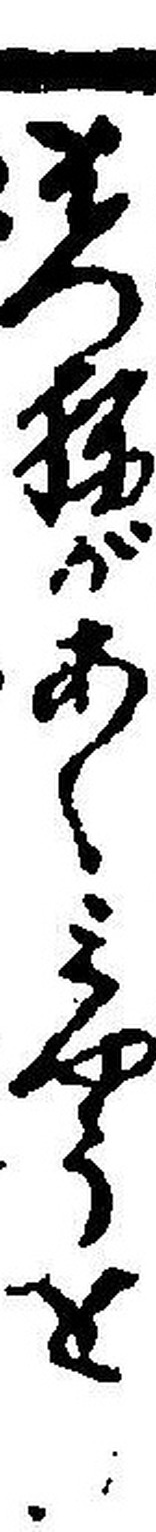はつねがあくみやうを
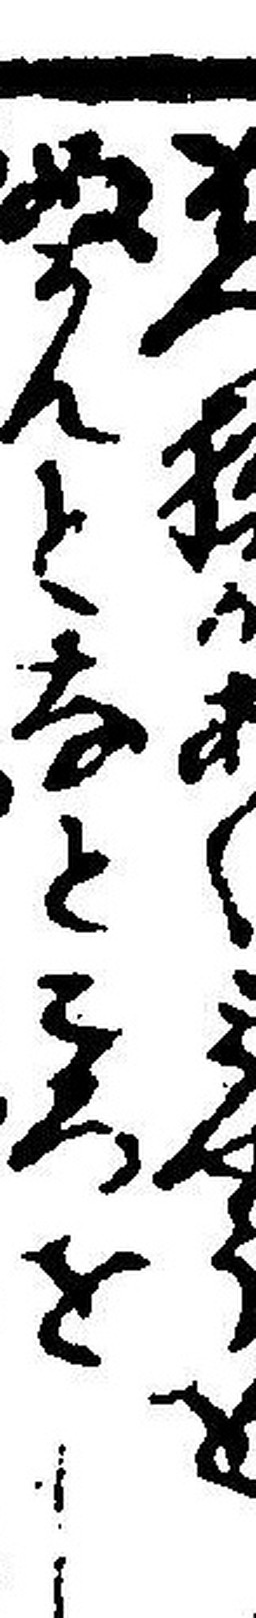ぬかんとなところを
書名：間違狐之女郎買 / 市場通笑作
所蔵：東京大学総合図書館 General Library in the University of Tokyo, JAPAN
